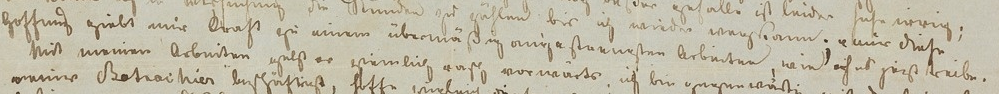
Hoffnung giebt mir Kraft zu einem übermäßig angestrengten Arbeiten, wie ich es jezt treibe.
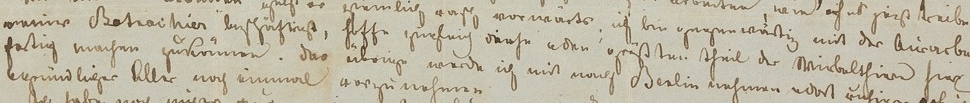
meiner Batrachier beschäftigt, hoffe zugleich diese & den größten Theil der Wirbelthiere hier
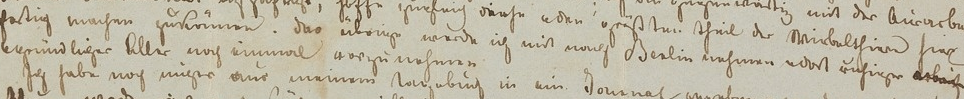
fertig machen zu können. Das übrige werde ich mit nach Berlin nehmen & dort ruhiger arbeiten
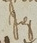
Ich
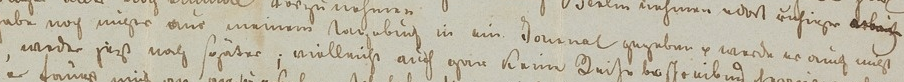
habe noch nichts aus meinem Tagebuch in ein Journal gegeben & werde es auch nicht
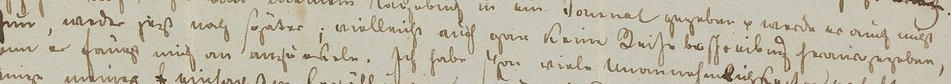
thun, weder jezt noch später; vielleicht auch gar keine Reisebeschreibung herausgegeben,
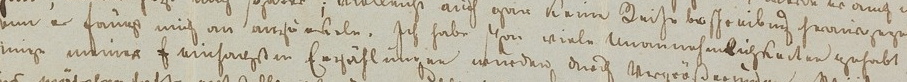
denn es fängt mich an anzuekeln. Ich habe schon viele Unannehmlichkeiten gehabt.
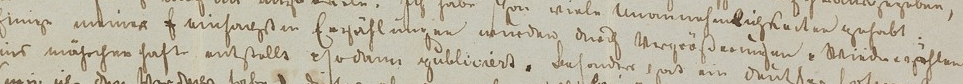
Einige meiner E einfachsten Erzählungen wurden durch Vergrößerungen & Wiedererzählen
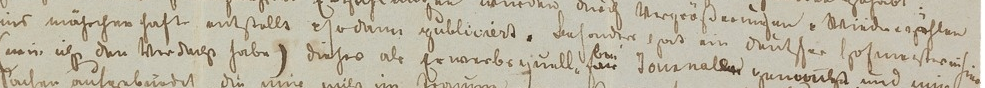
ins mährchenhafte entstellt & sodann publiciert. Besonders hat ein deutscher Hofmeister in hier
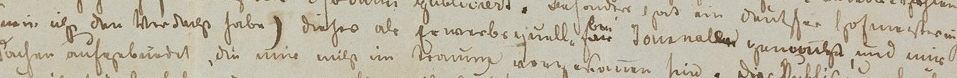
(wie ich den Verdacht habe) dieses als Erwerbsquelle fürbei Journalen gemacht, und mir
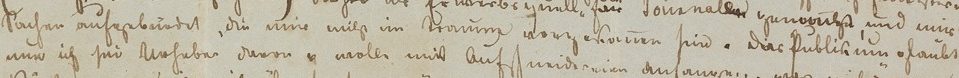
Sachen aufgebürdet, die mir nicht im Traume vorgekommen sind. Das Publikum glaubt
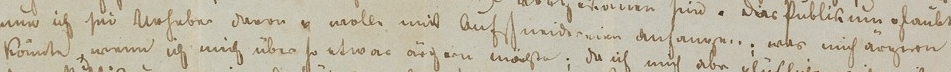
nun ich sei Urheber davon & wolle mit Aufschneidereien anfangen; was mich ärgern
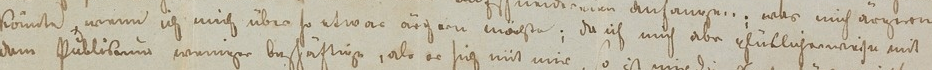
könnte, wenn ich mich über so etwas ärgern möchte; da ich mich aber glüklicherweise mit
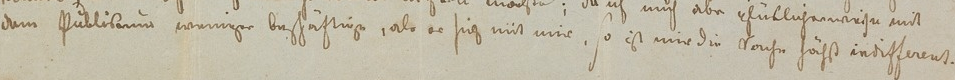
dem Publikum weniger beschäftige, als es sich mit mir, so ist mir die Sache höchst indifferent.
